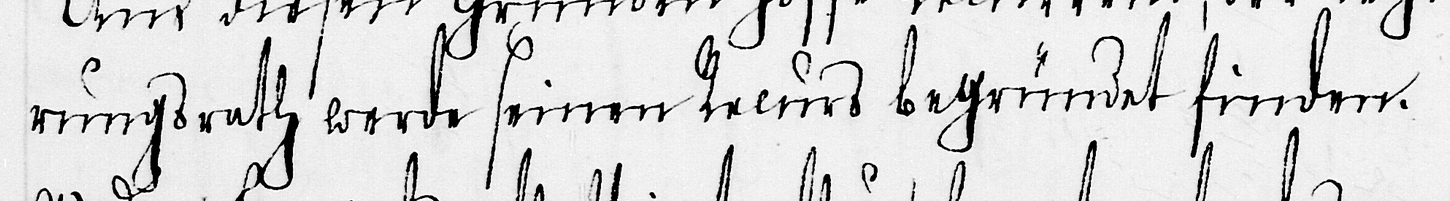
rungsrath werde seinen Recurs begründet finden.
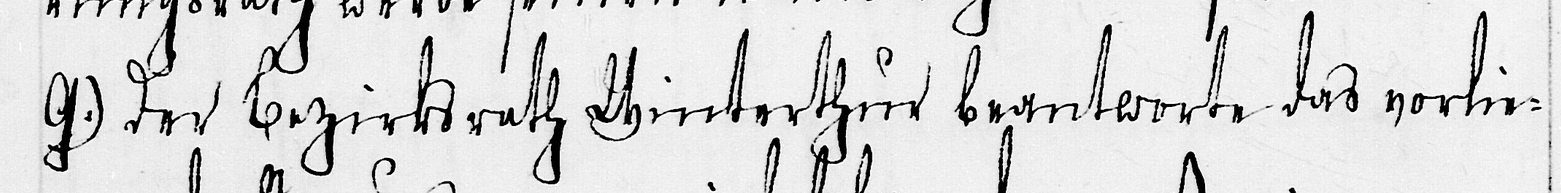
G.) Der Bezirksrath Winterthur beantworte das vorlie¬
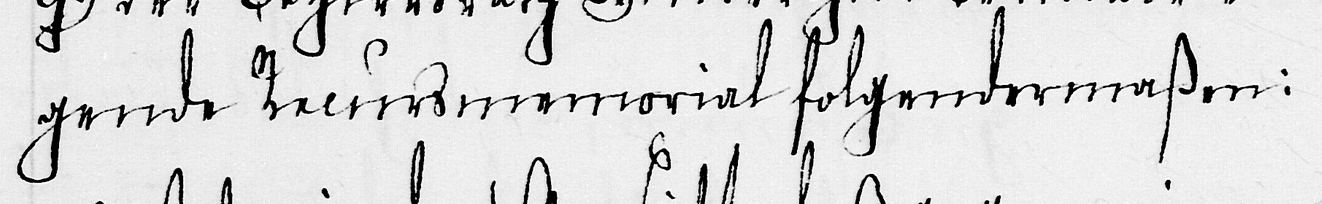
gende Recursmemorial folgendermaßen:
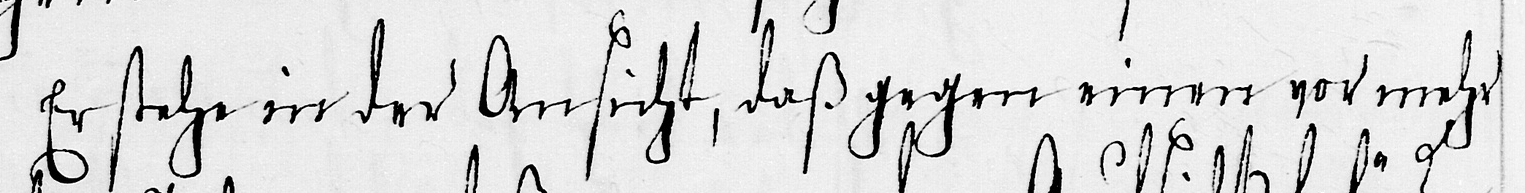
Er stehe in der Ansicht, daß gegen einen vor mehr
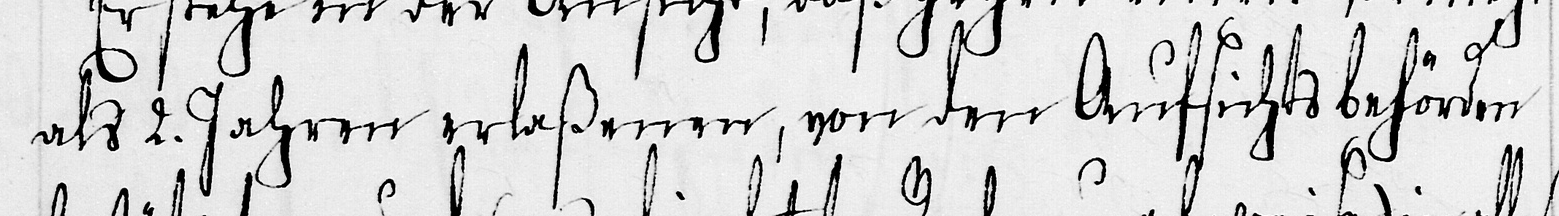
als 2. Jahren erlaßenen, von den Aufsichtsbehörden
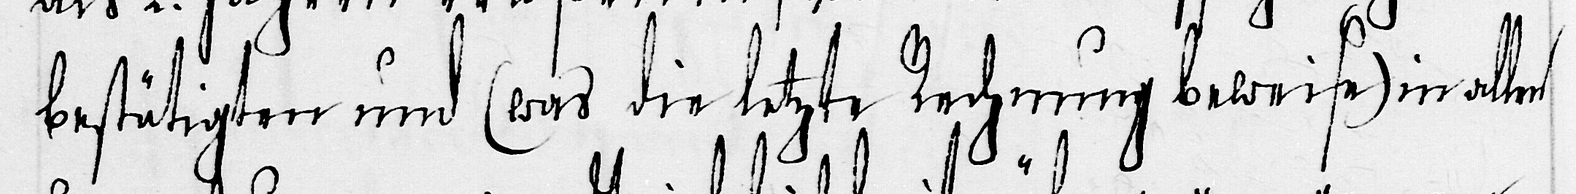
bestätigten und (was die letzte Rechnung beweise) in al¬
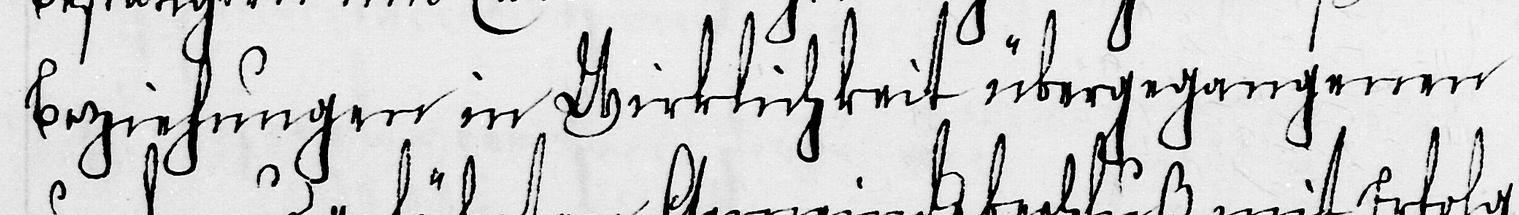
Beziehungen in Wirklichkeit übergangenen
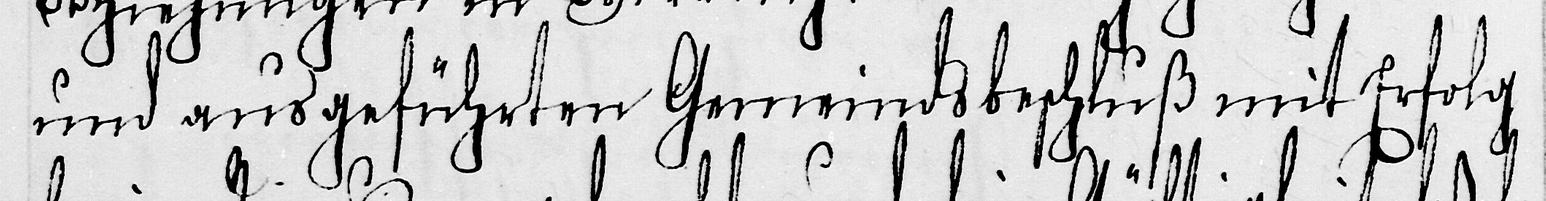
und ausgeführten Gemeindsbeschluß mit Erfolg
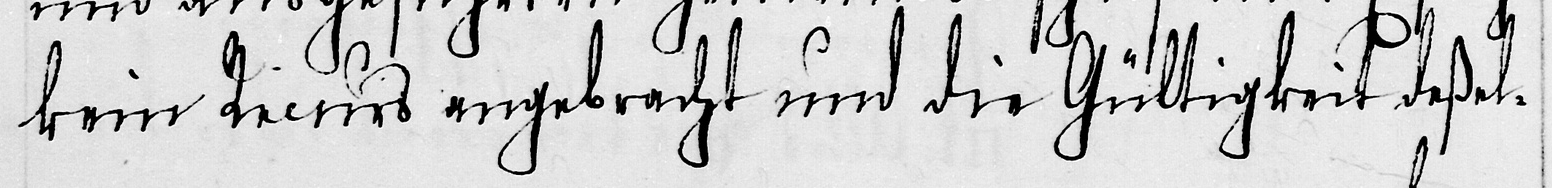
kein Recurs angebracht und die Gültigkeit deßel-
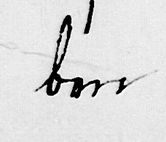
len
